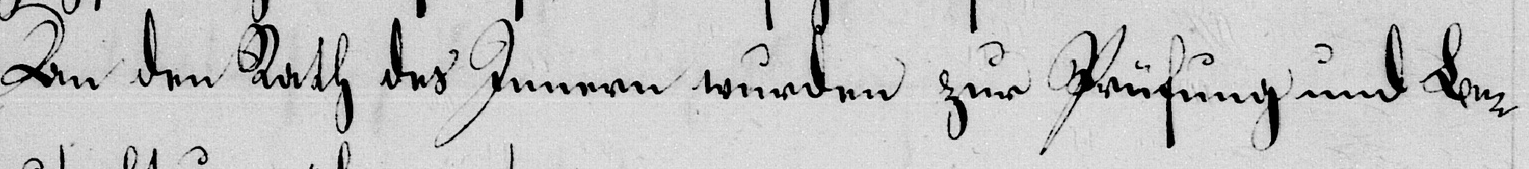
An den Rath des Innern wurden zur Prüfung und Begu¬
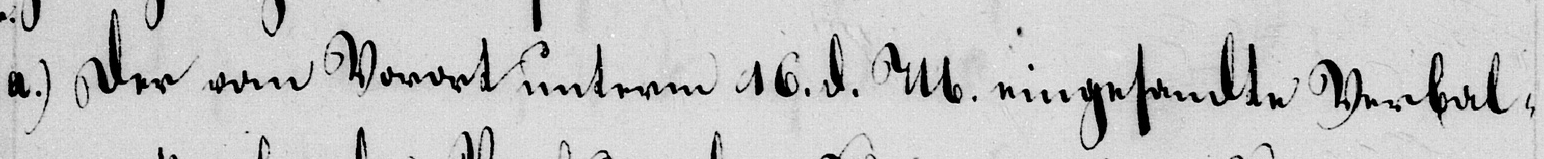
a.) Der vom Vorort unterm 16. d. M. eingesandte Verbal¬
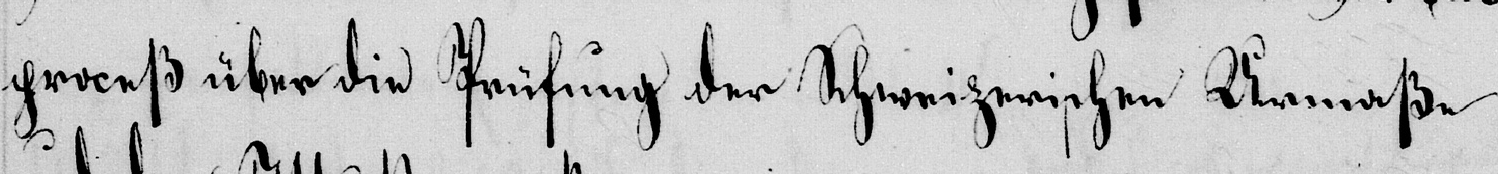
proceß über die Prüfung der Schweizerischen Urmaße
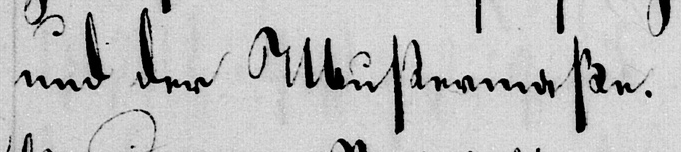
und der Mustermaße.
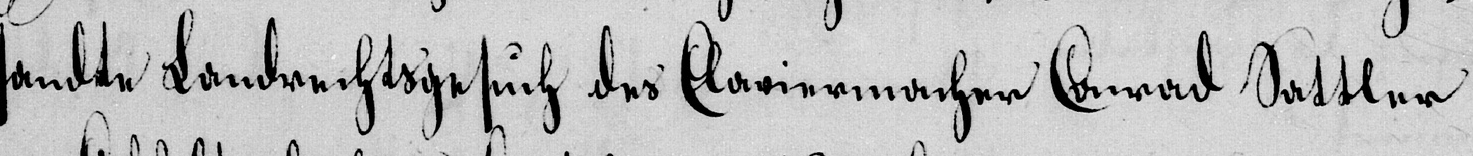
sandte Landrechtsgesuch des Claviermacher Conrad Sattler
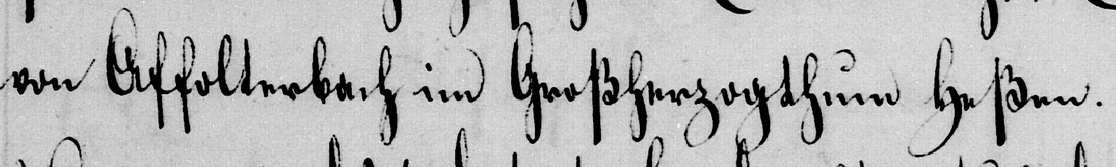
von Affolterbach im Großherzogthum Heßen.
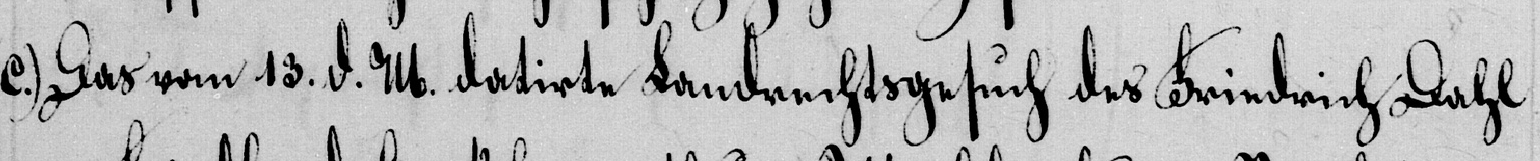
c.) Das vom 13. d. M. datirte Landrechtsgesuch des Friedrich Dahl
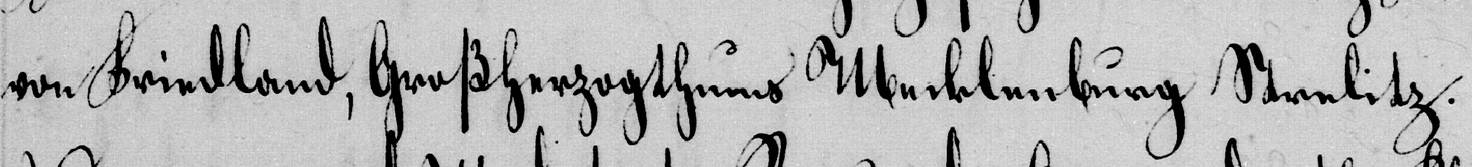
von Friedland, Großherzogthum Mecklenburg Strelitz.
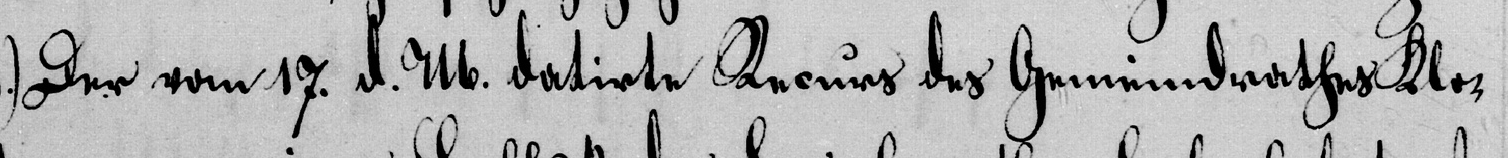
Der vom 17. d. M. datirte Recurs des Gemeindrathes Klo¬
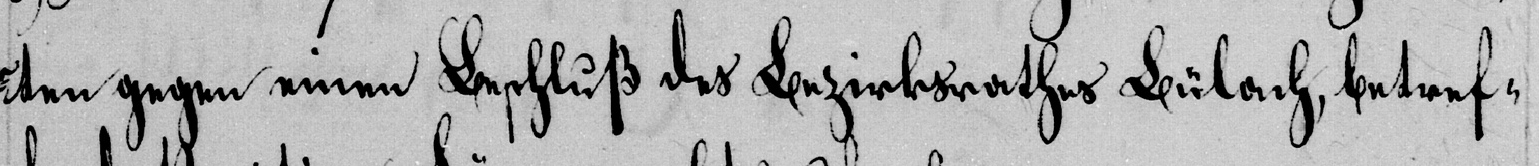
ten gegen einen Beschluß des Bezirksrathes Bülach, betref¬
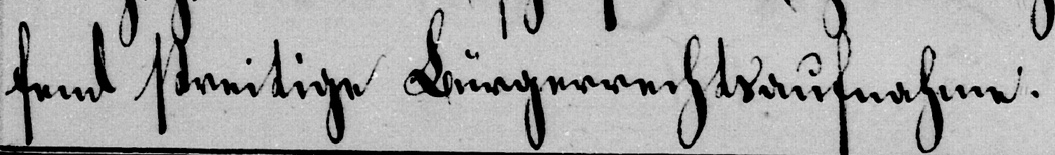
fend streitige Bürgerrechtsaufnahme.
